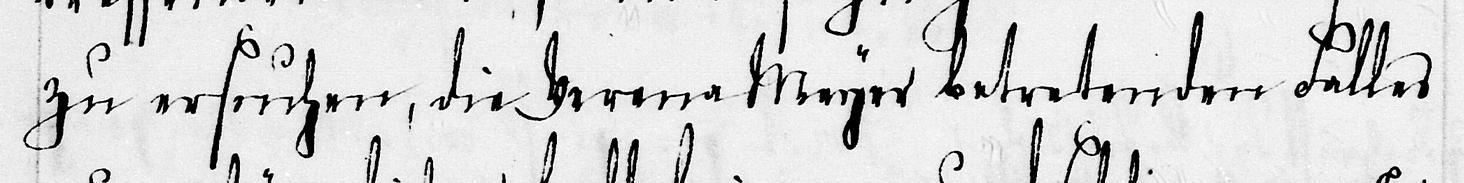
zu ersuchen, die Verena Meyer betretenden Falles
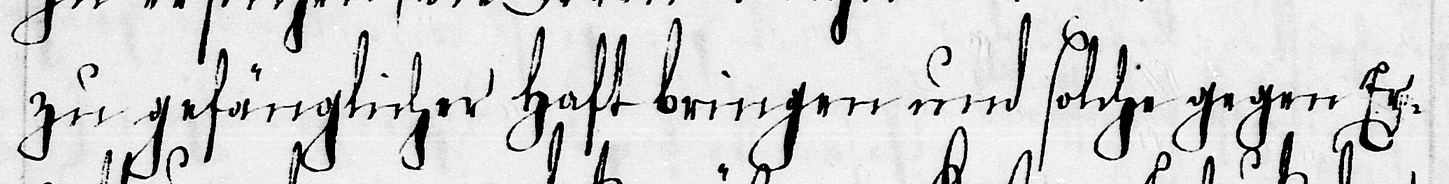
zu gefänglicher Haft bringen und solche gegen Er¬
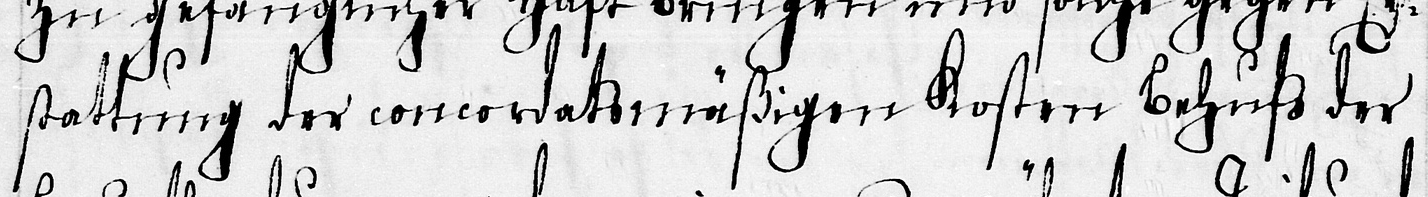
stattung der concordatsmäßigen Kosten Behufs der
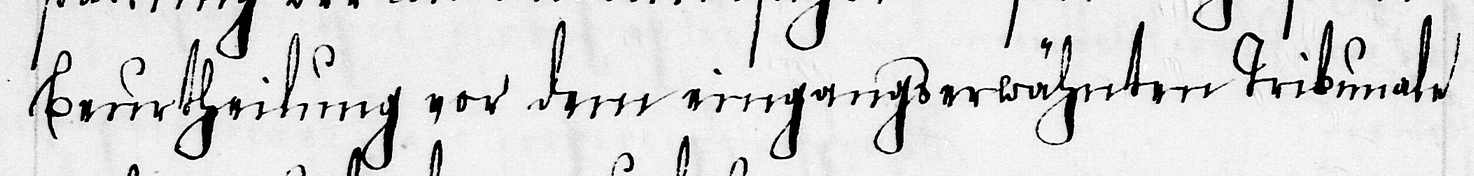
Beurtheilung vor dem eingangserwähnten Tribunale
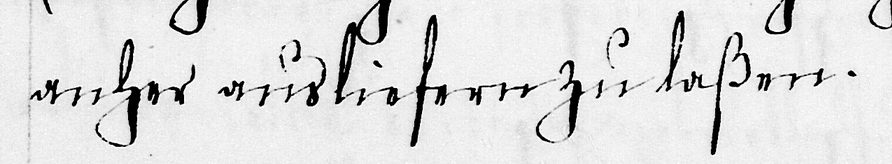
anher ausliefern zu laßen.
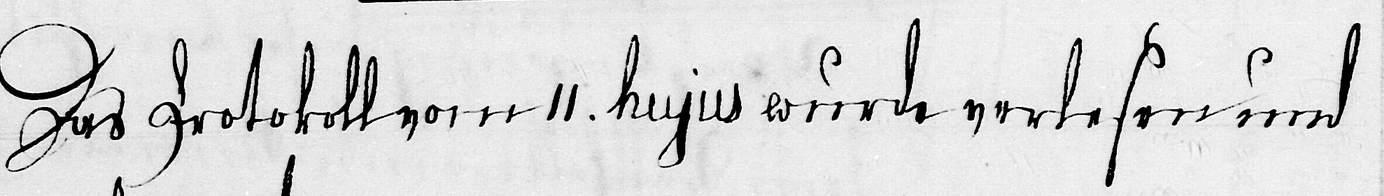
Das Protokoll vom 11. hujus wurde verlesen und
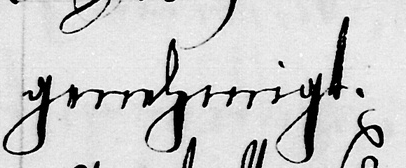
genehmigt.
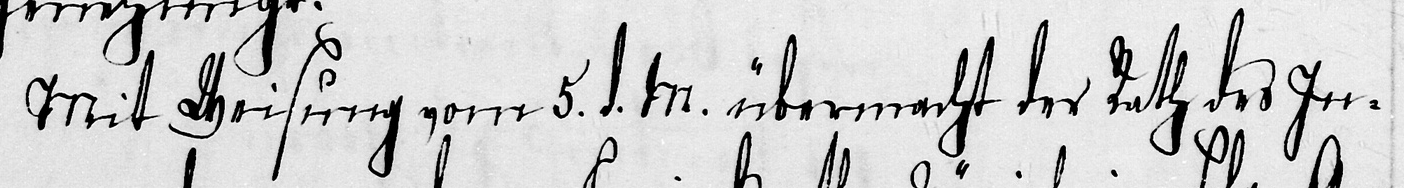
Mit Weisung vom 5. d. M. übermacht der Rath des In¬
